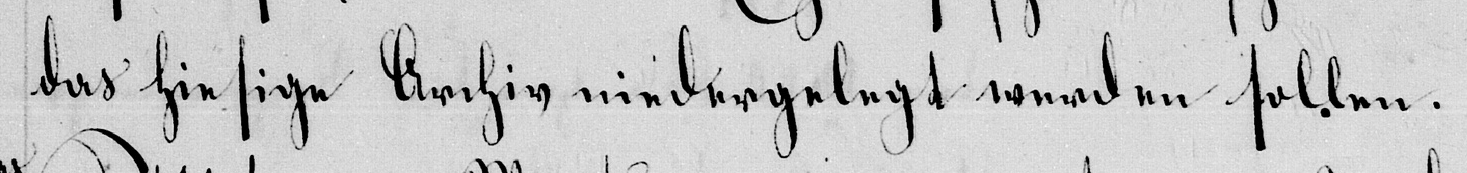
das hiesige Archiv niedergelegt werden sollen.
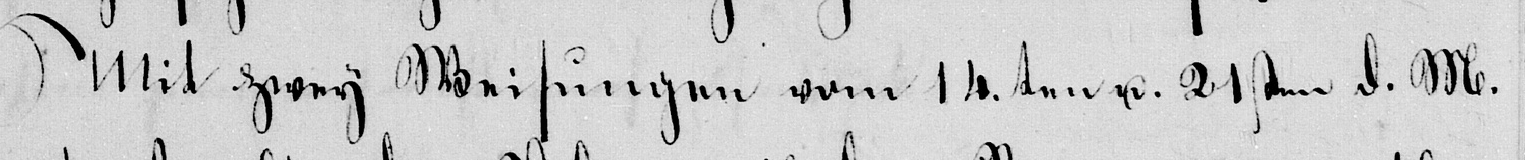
Mit zwey Weisungen vom 14.ten u. 21sten d. M.
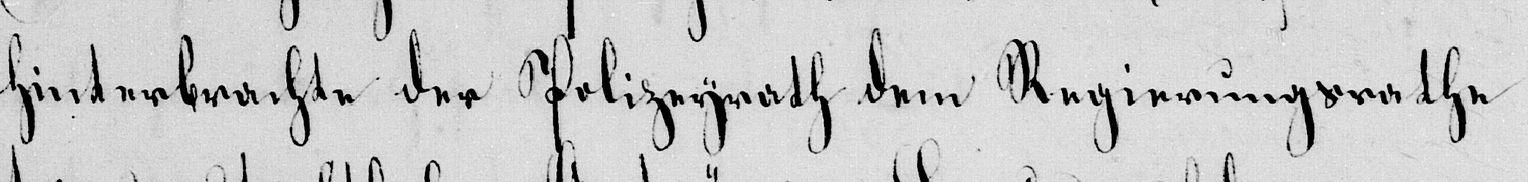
hinterbrachte der Polizeyrath dem Regierungsrathe
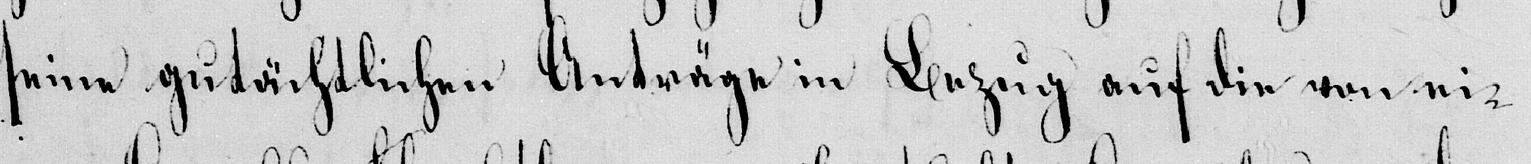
seine gutächtlichen Anträge in Bezug auf die von ei¬
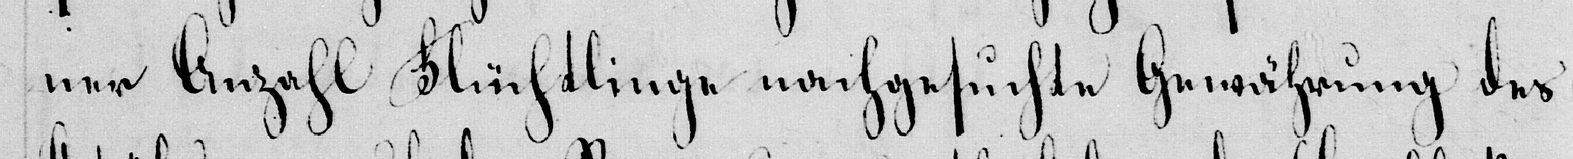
ner Anzahl Flüchtlinge nachgesuchte Gewährung des
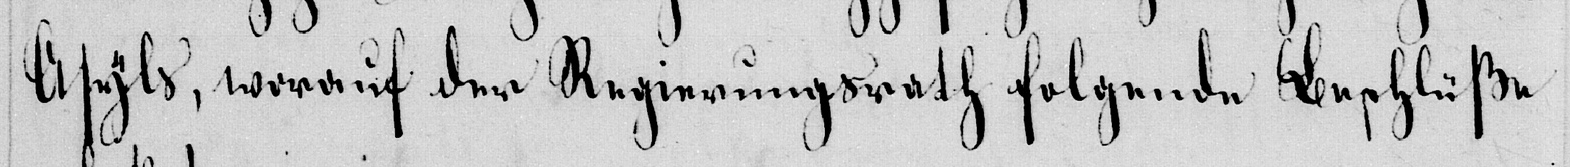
Asyls, worauf der Regierungsrath folgende Beschlüße
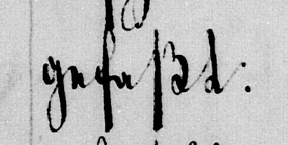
gefaßt:
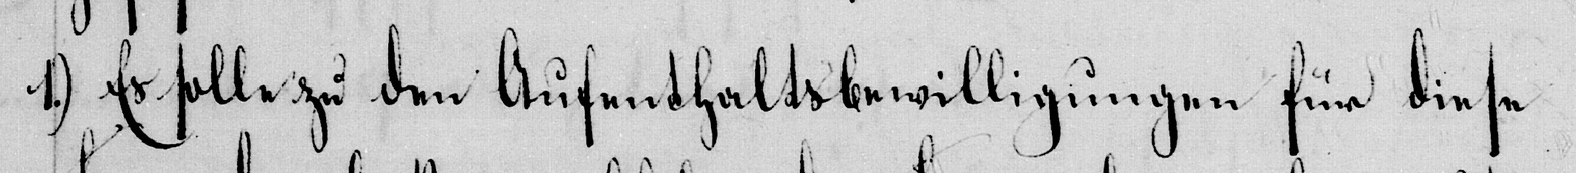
1.) Es solle zu den Aufenthaltsbewilligungen für diese
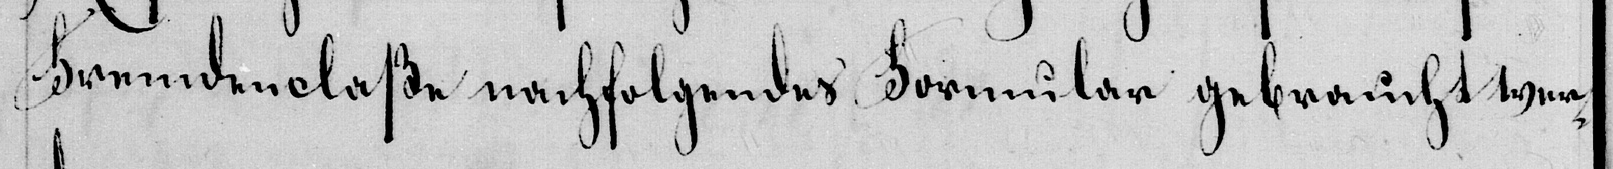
Fremdenclaße nachfolgendes Formular gebraucht wer¬
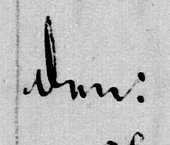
den:
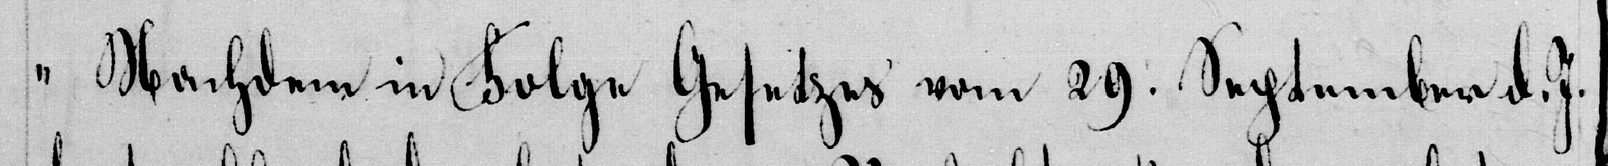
„Nachdem in Folge Gesetzes vom 29. September d. J.
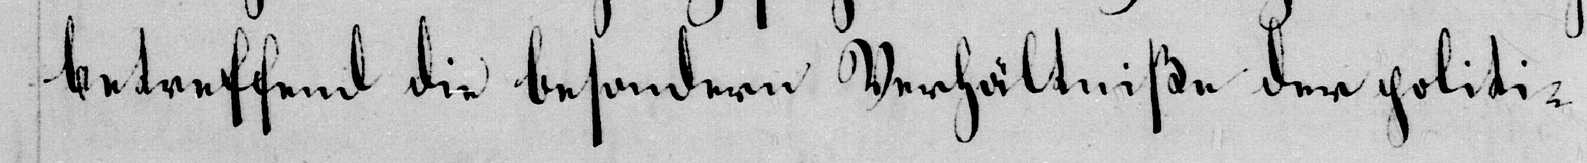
betreffend die besondern Verhältniße der politi-
